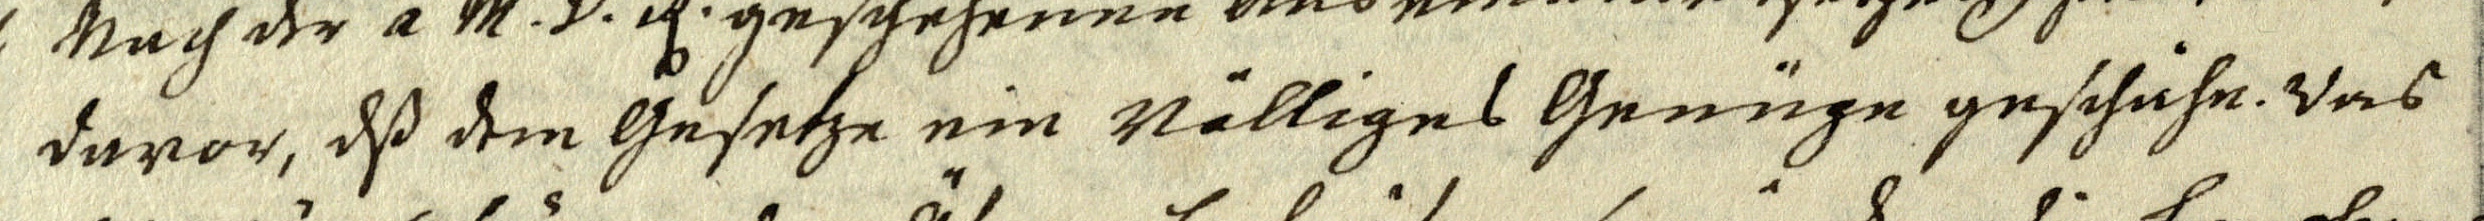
davor, daß dem Gesetze ein völliges Genüge geschähe. Was
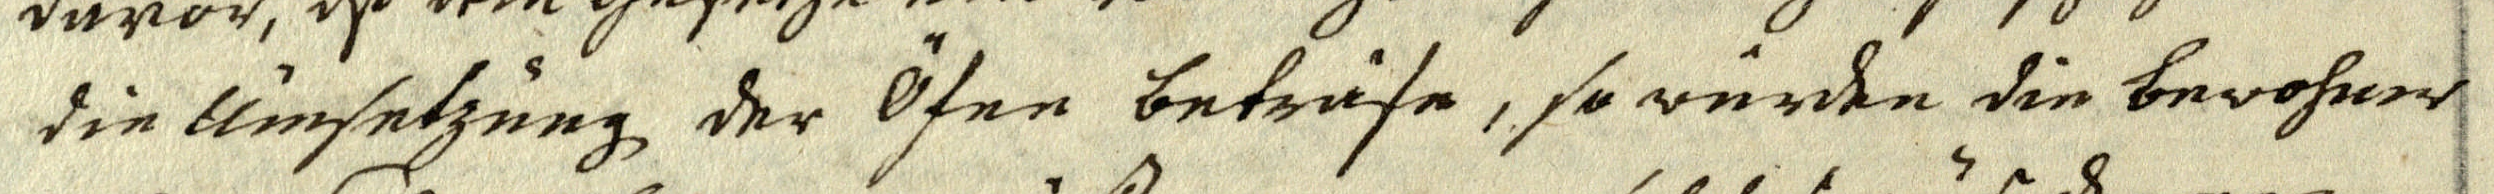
die Umsetzung der Öfen beträfe, so würden die Bewohner
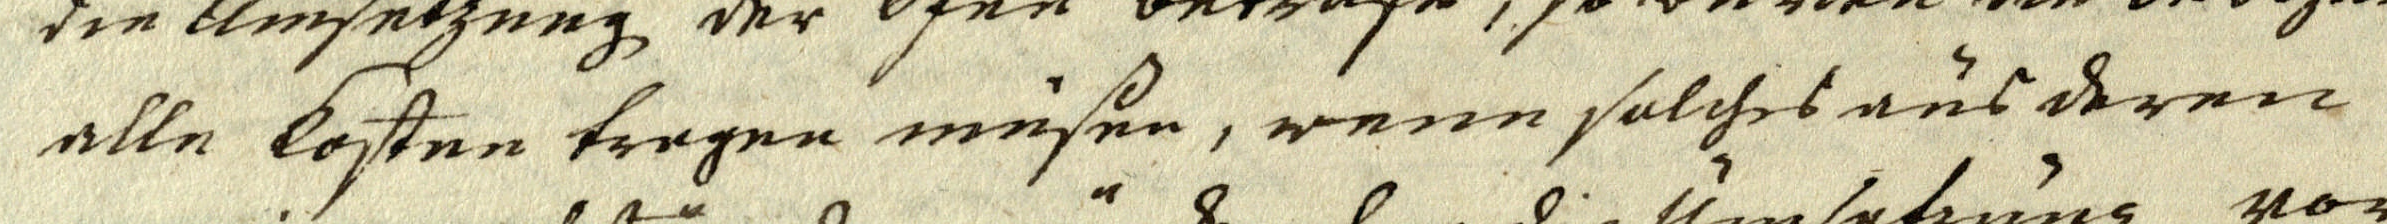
alle Kosten tragen müßen, wenn solches aus deren
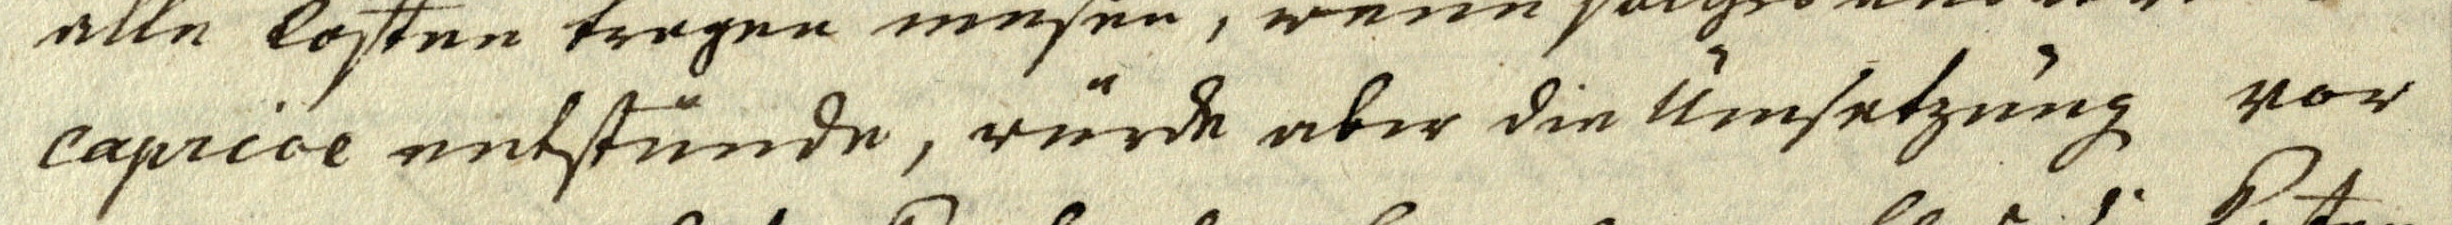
caprice entstünde, würde aber die Umsetzung vor
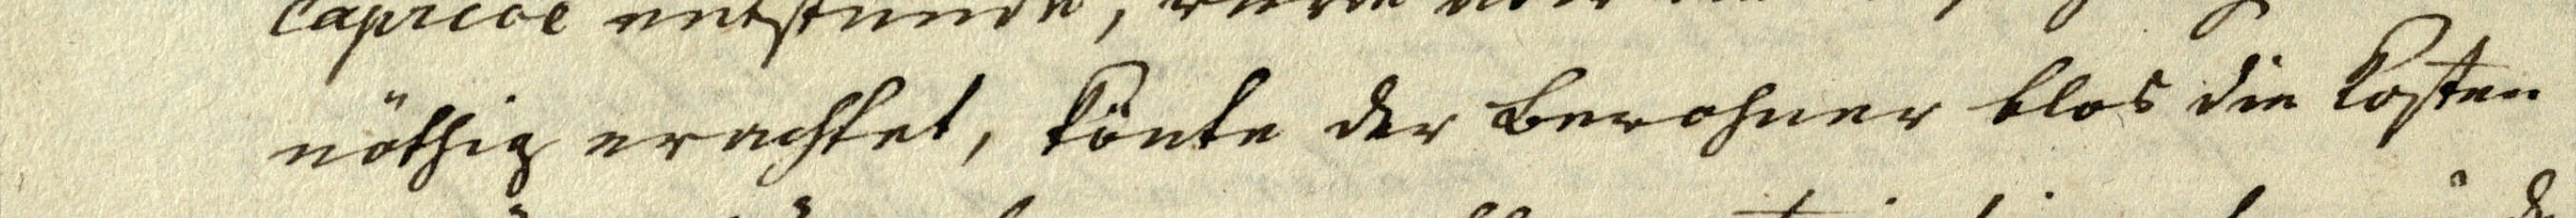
nöthig erachtet, könte der Bewohner blos die Kosten
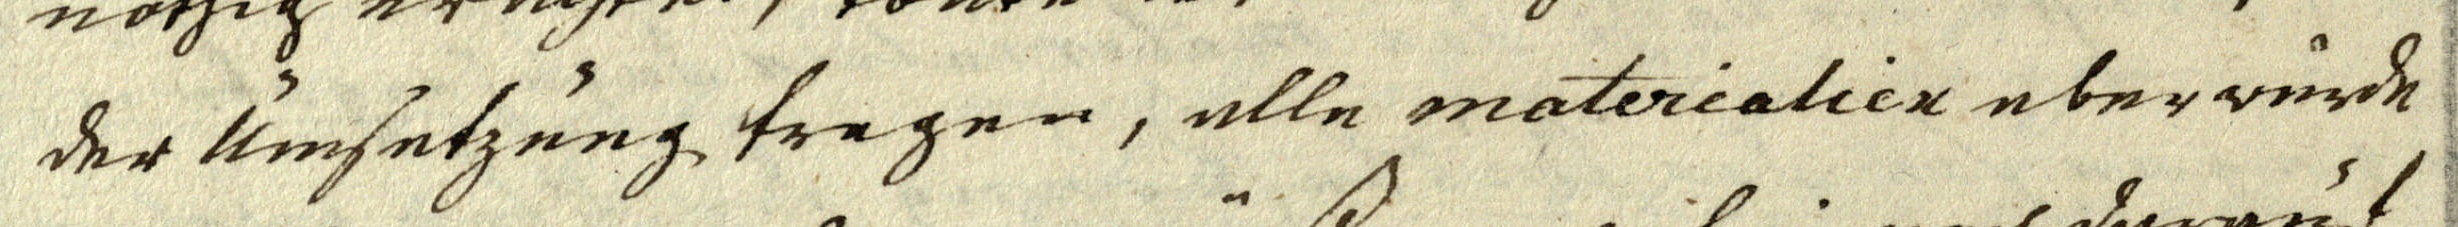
der Umsetzung tragen, alle materialien aber würde
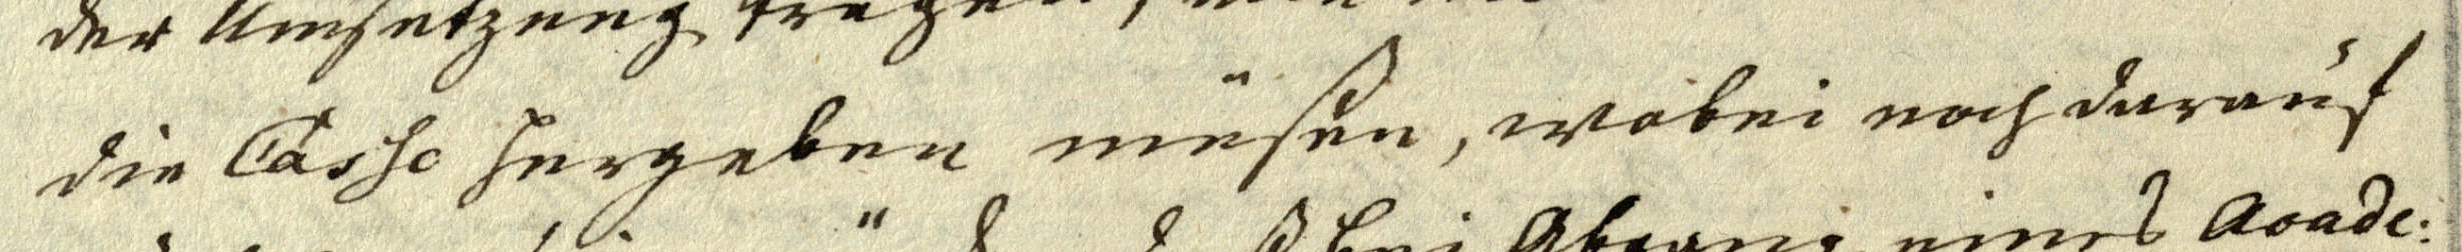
die Casse hergeben müßen, wobei noch darauf
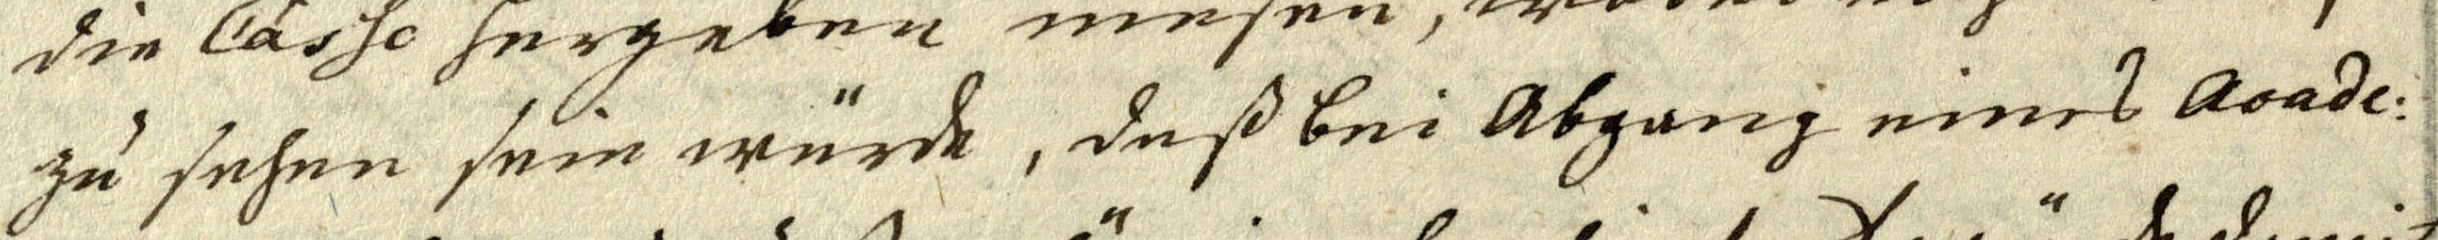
zu sehen sein würde, daß bei Abgang eines Acade¬
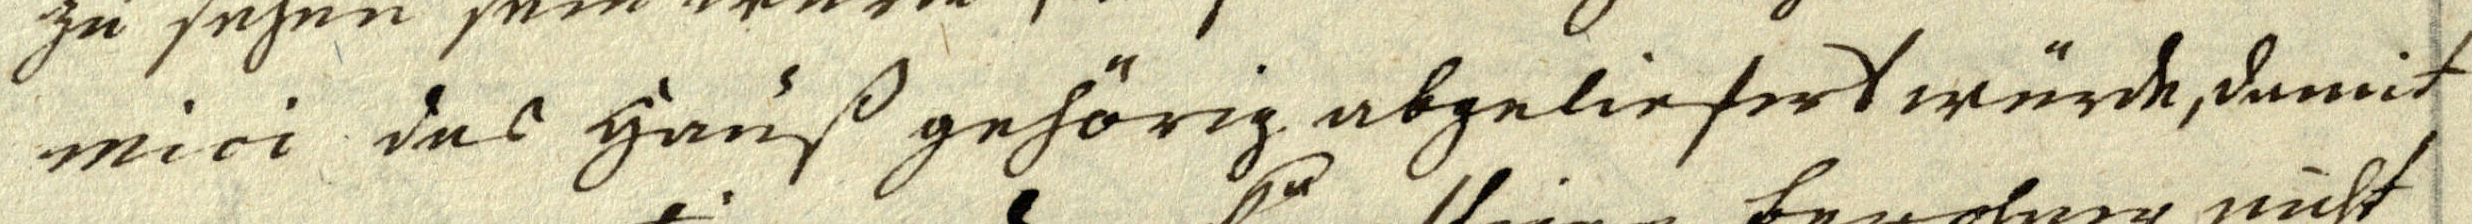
mici das Hauß gehörig abgeliefert würde, damit
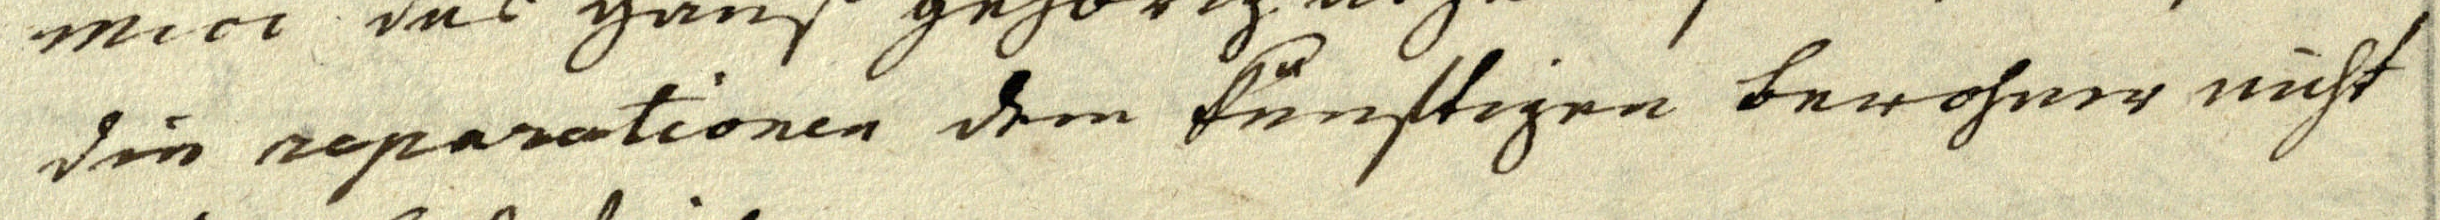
die reparationen dem künftigen Bewohner nicht
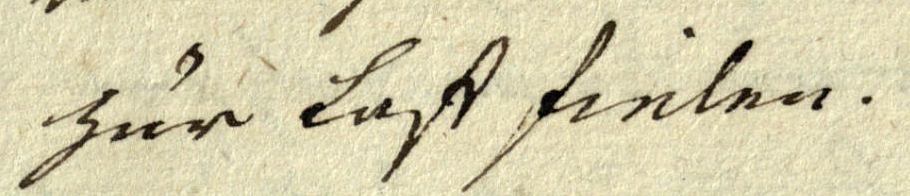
zur Last fielen.
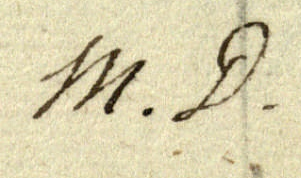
M. D.
